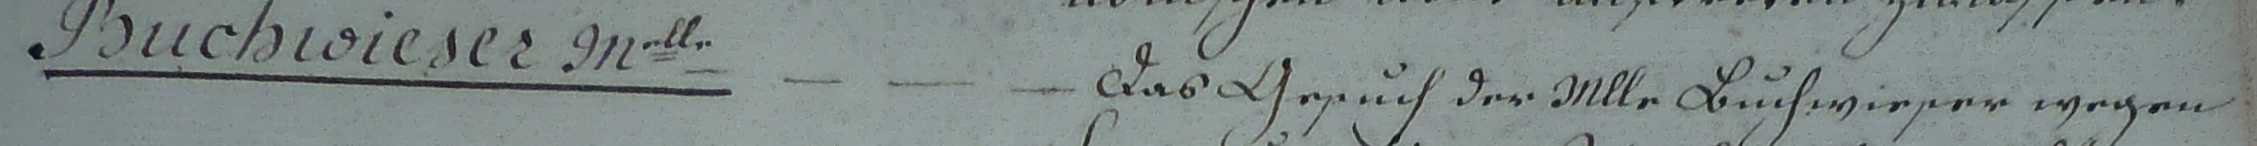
Buchwieser Mel͇le_ _ _ _ Das Gesuch der Mlle Buchwieser wegen
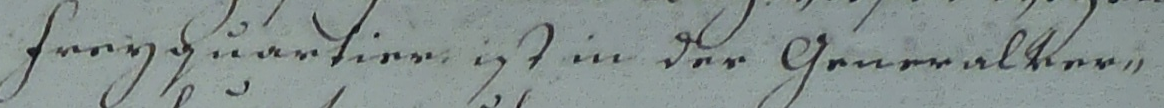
Freyquartier ist in der Generalver¬
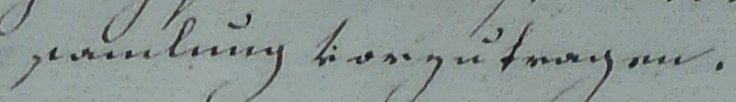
samlung vorzutragen.
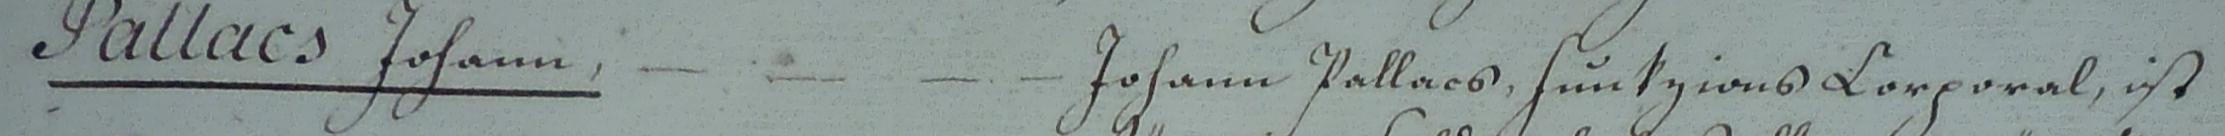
Pallacs Johann, _ _ _ _ Johann Pallacs, Funkzions Corporal, ist
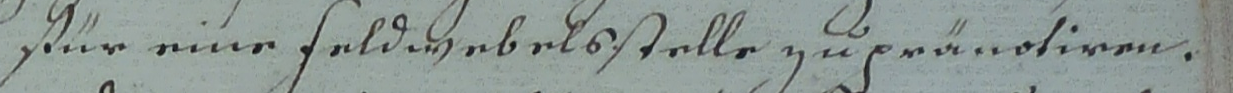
für eine Feldwebelstelle zupränotiren.
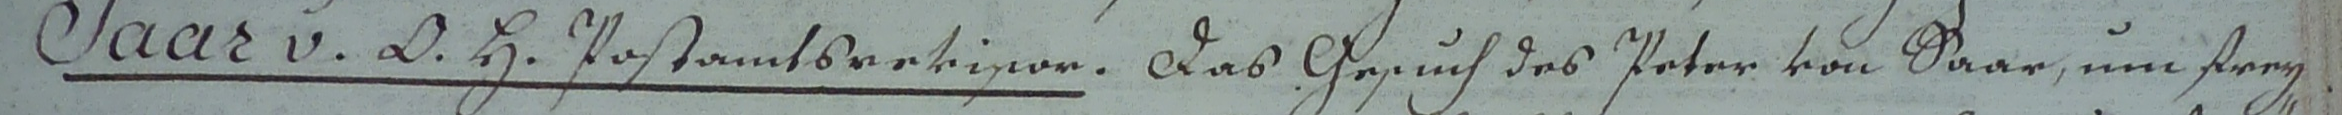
Saar v. D. H. Postamtsrevisor . Das Gesuch des Peter von Saar, um frey¬
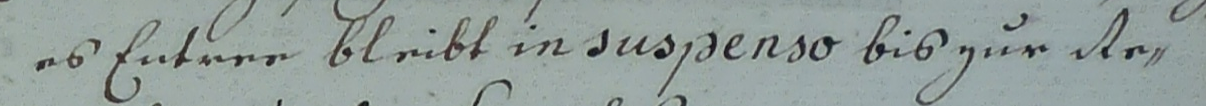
es Entree bleibt in suspenso bis zur Re¬
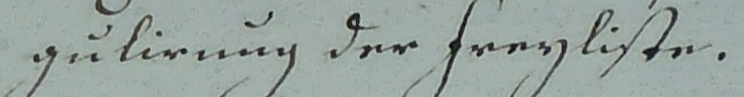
gulirung der Freyliste.
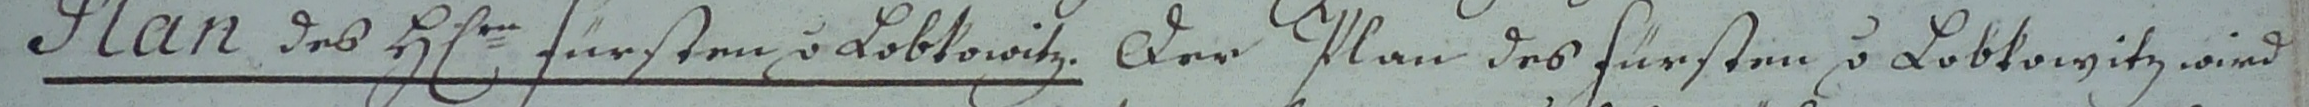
Plan des HErn͇ Fürsten v Lobkowitz. Der Plan des Fürsten v Lobkowitz wird
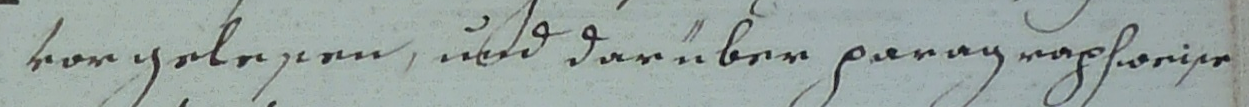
vorgelesen, und darüber paragraphweise
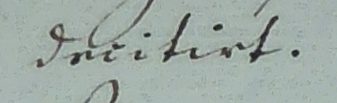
decitirt.
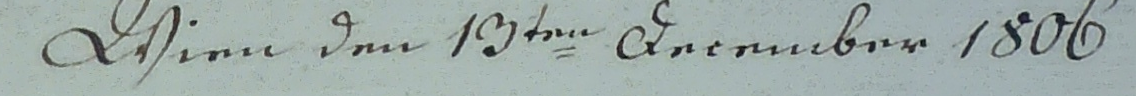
Wien den 13te͇n December 1806
